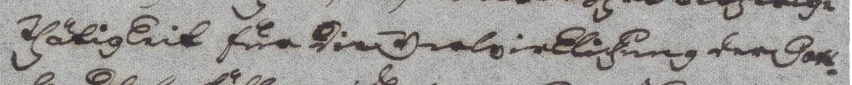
Thätigkeit für die Verwirklichung der Gott-
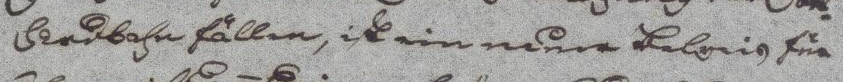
hardbahn fällen, ist ein neuer Beweis für
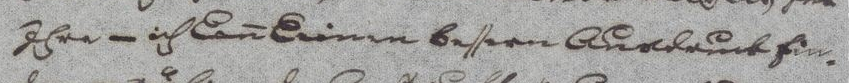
Ihre – ich kann keinen bessern Ausdruck fin-
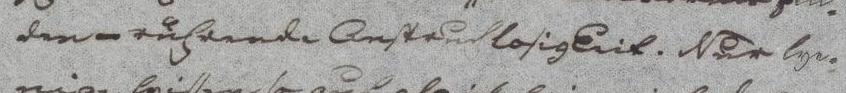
den – rührende Anspruchlosigkeit. Nur we-
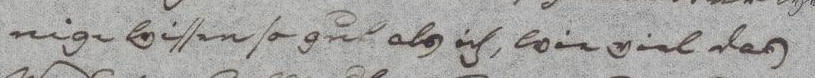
nige wissen so gut als ich, wie viel das
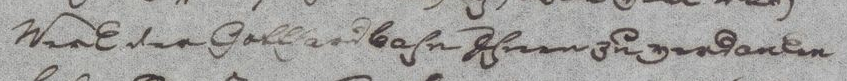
Werk der Gotthardbahn Ihnen zu verdanken
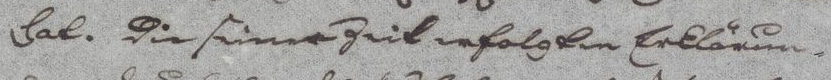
hat. Die seiner Zeit erfolgten Erklärun-
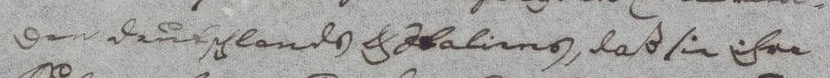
gen Deutschlands, & Italiens, daß sie ihre
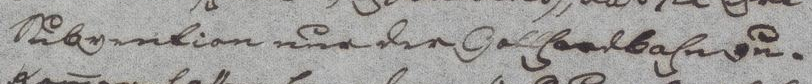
Subvention nur der Gotthardbahn zu-
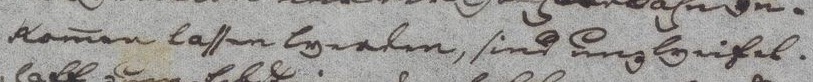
kommen lassen werden, sind unzweifel-
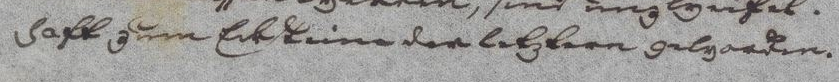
haft zum Eckstein der letztern geworden.
